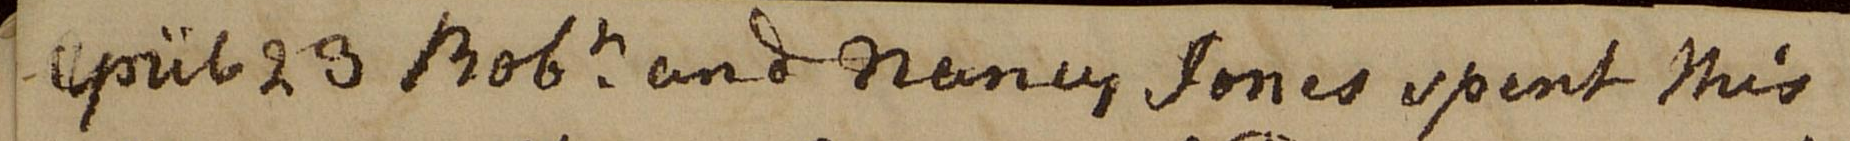April 23 Rob^t. and Nancy Jones spent this
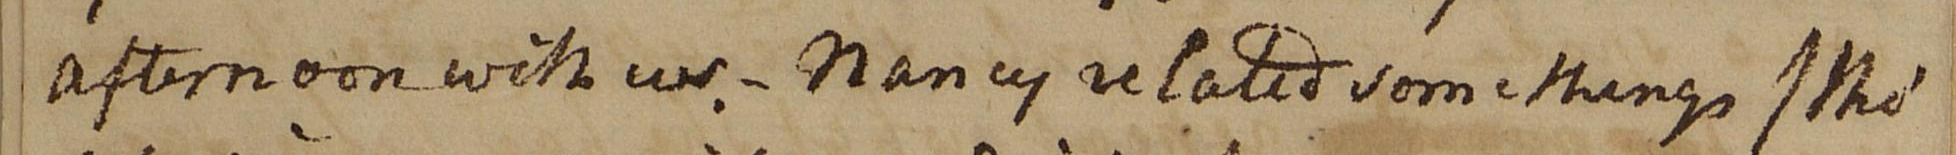afternoon with us- Nancy related somethings /tho'
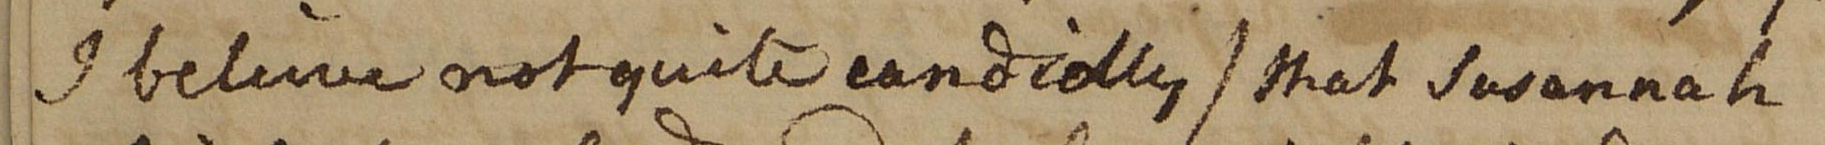I believe not quite candidly/ that Susannah
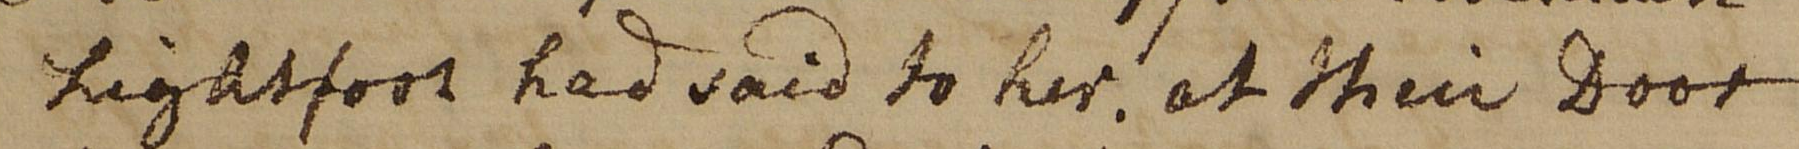Lightfoot had said to her. at their Door
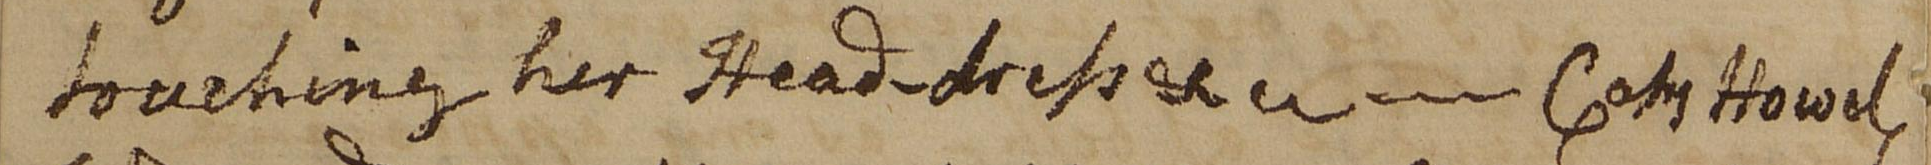touching her Head- dress &c -- Caty Howel
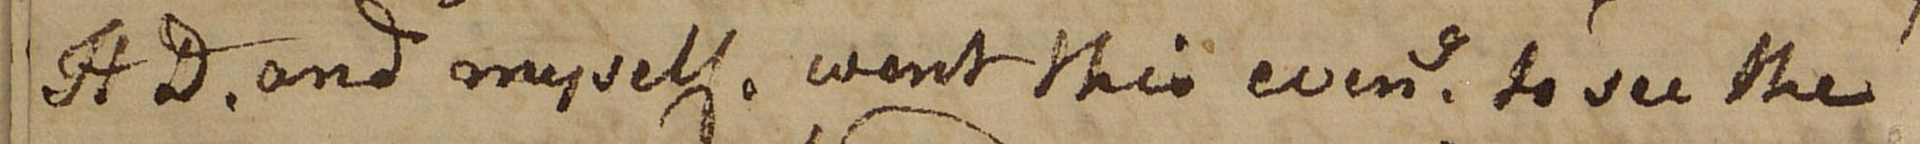HD. and myself, went this even^g. to see the
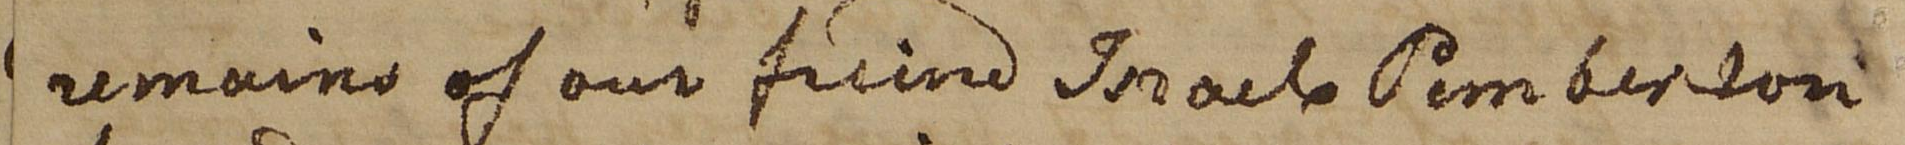remains of our friend Israel Pemberton
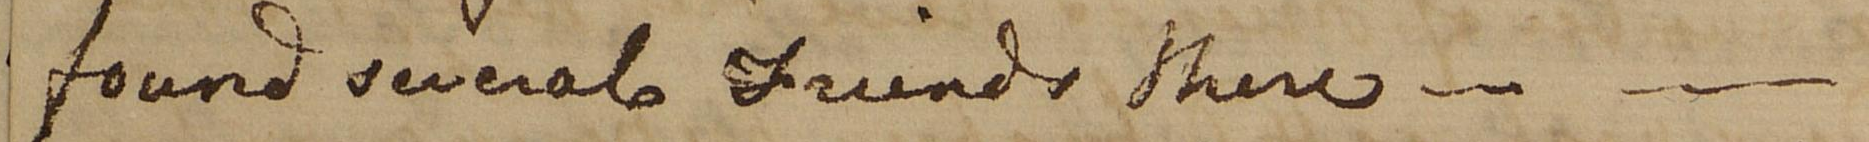found several Friends there--
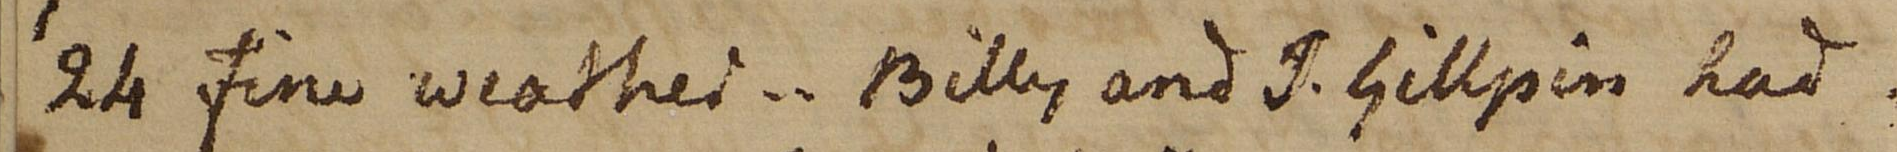24 fine weather- Billy and I. Gillpin had
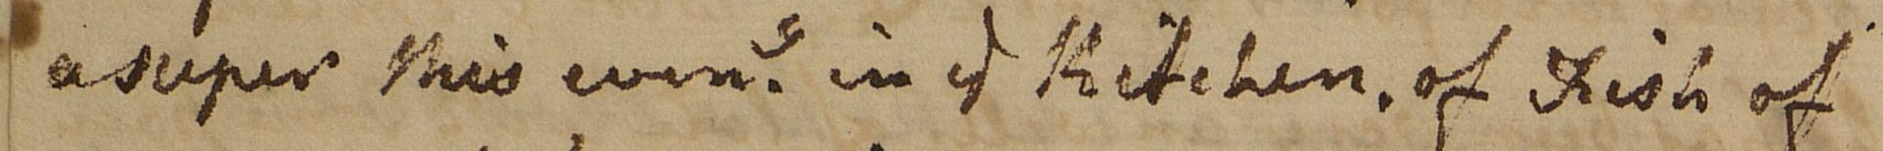a super this even^g. in y^e Kitchen. of Fish of
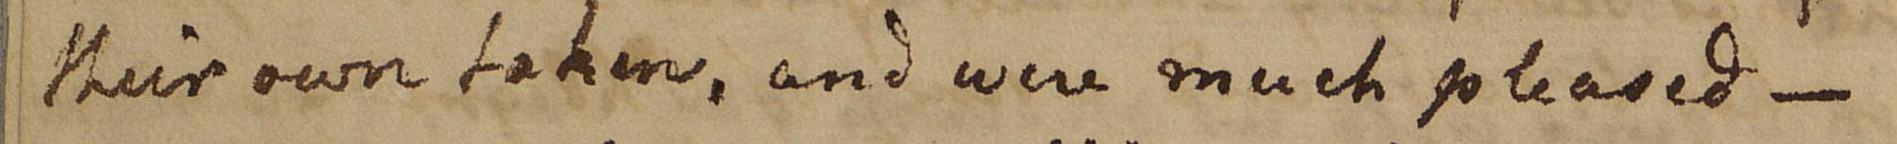their own taken, and were much pleased-
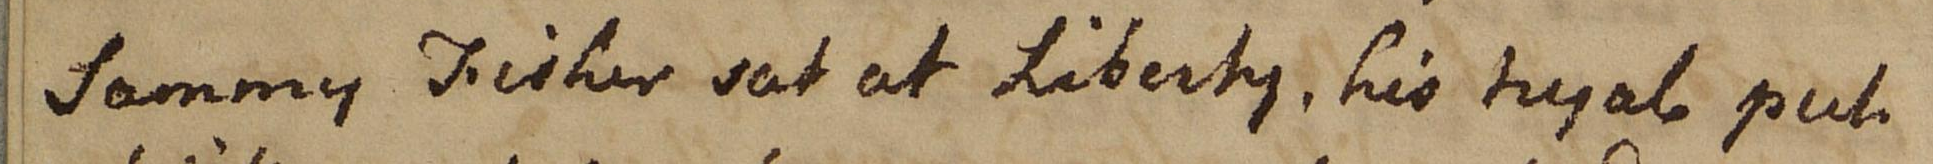Sammy Fisher sat at Liberty, his tryal put
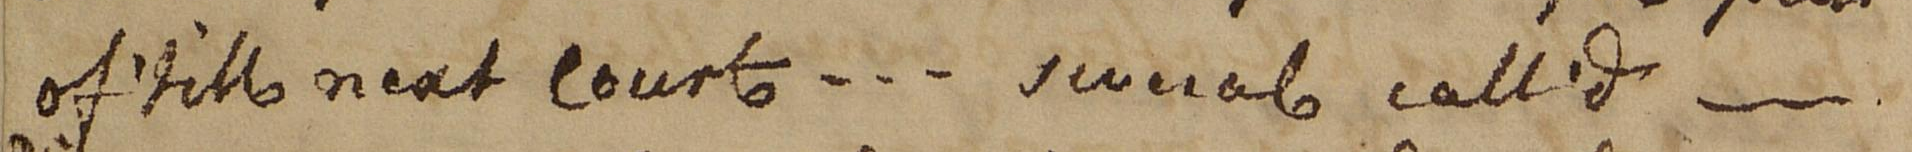of 'till next court--- several call'd-
